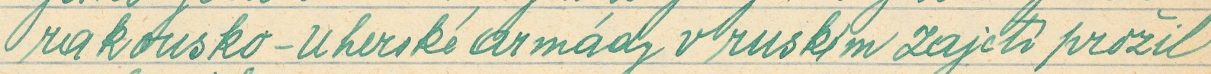rakousko-uherské armády v ruském zajetí prožil
